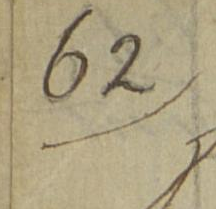62
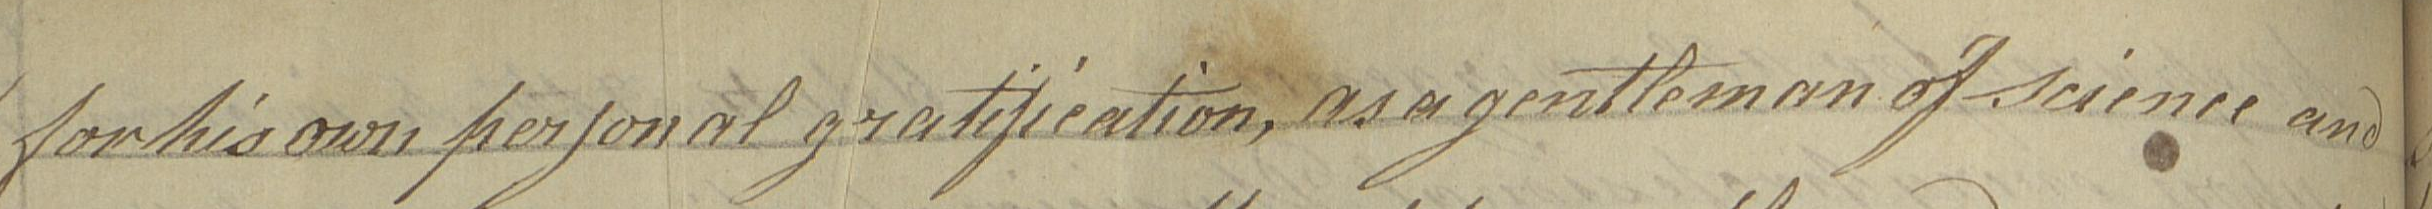for his own personal gratification, as a gentleman of science and
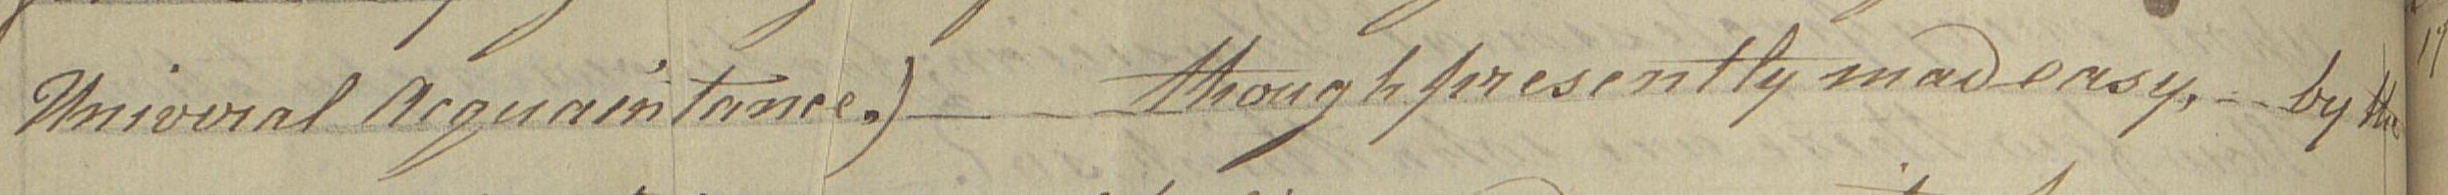Universal Acquaintance.) though presently mad easy, by the
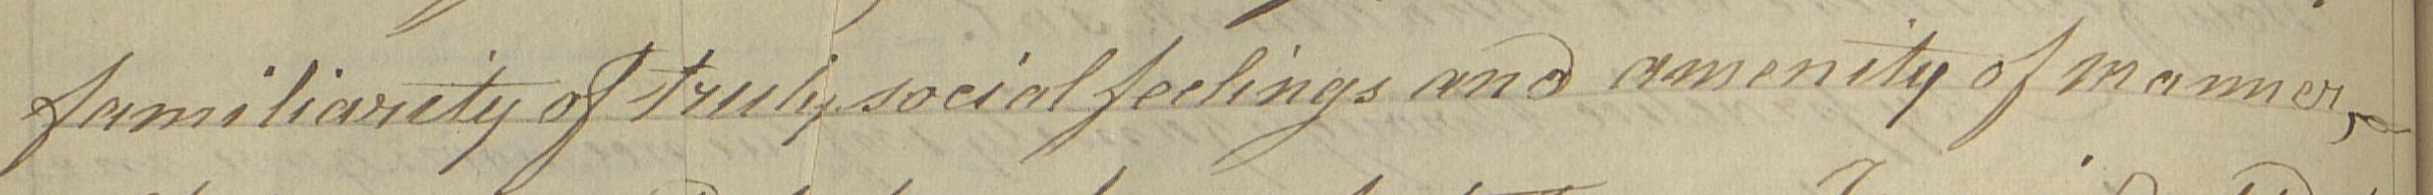familiarity of truly social feelings and amenity of manner,
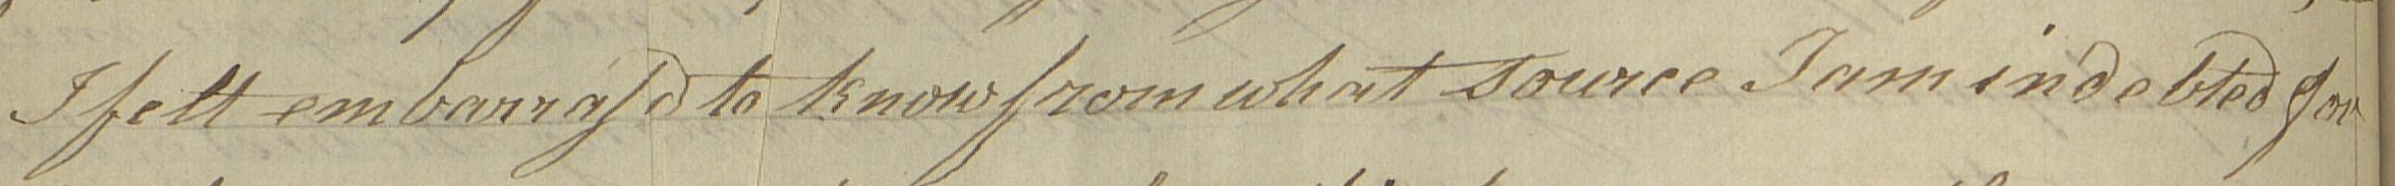I felt embarras'd to know from what Source I am indebted for
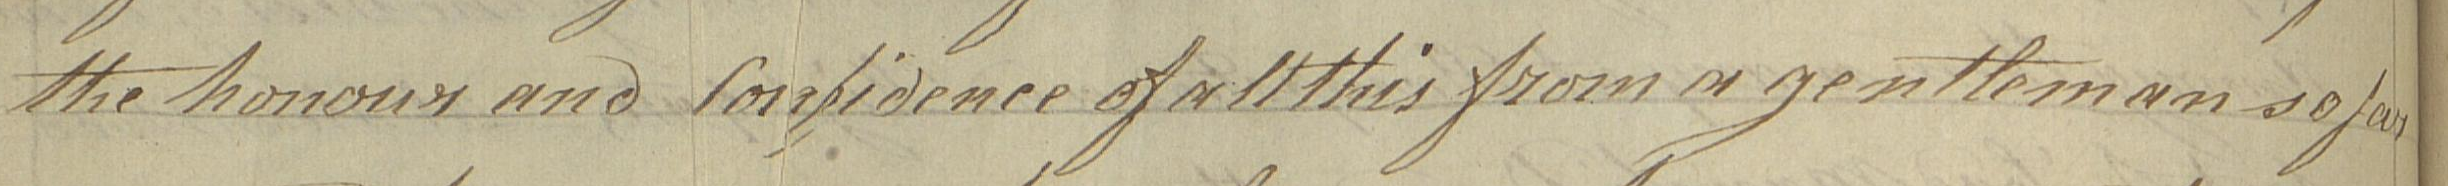the honour and Confidence of all this from a gentleman so far
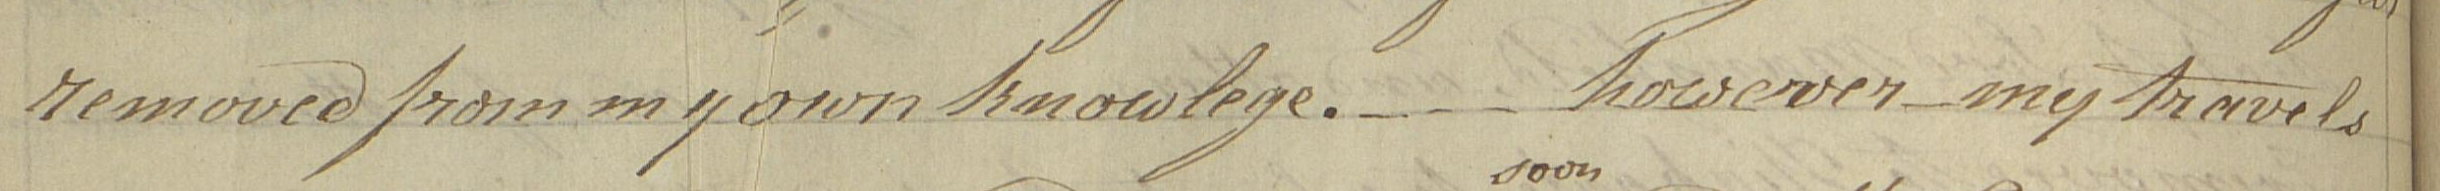removed from my own knowlege. however my travels
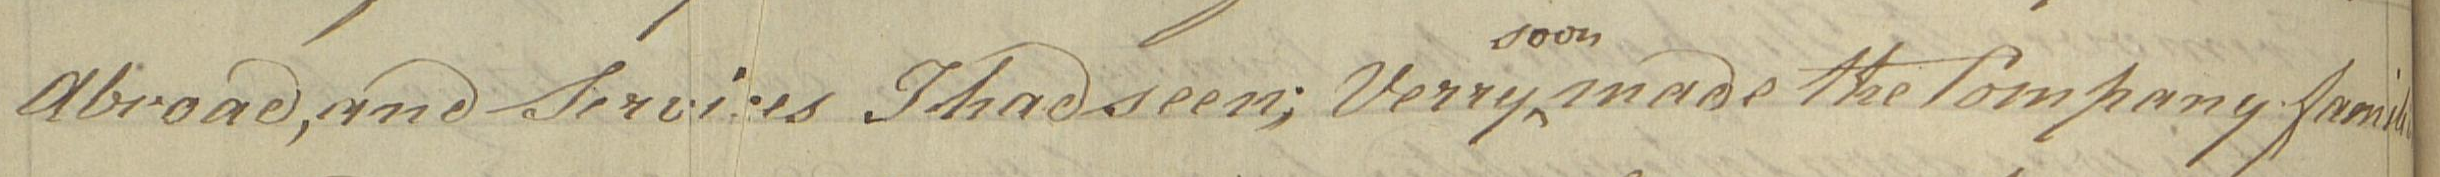Abroad, and Services I had seen; Verry ^ made the Company fami-
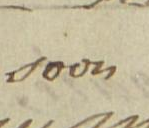soon
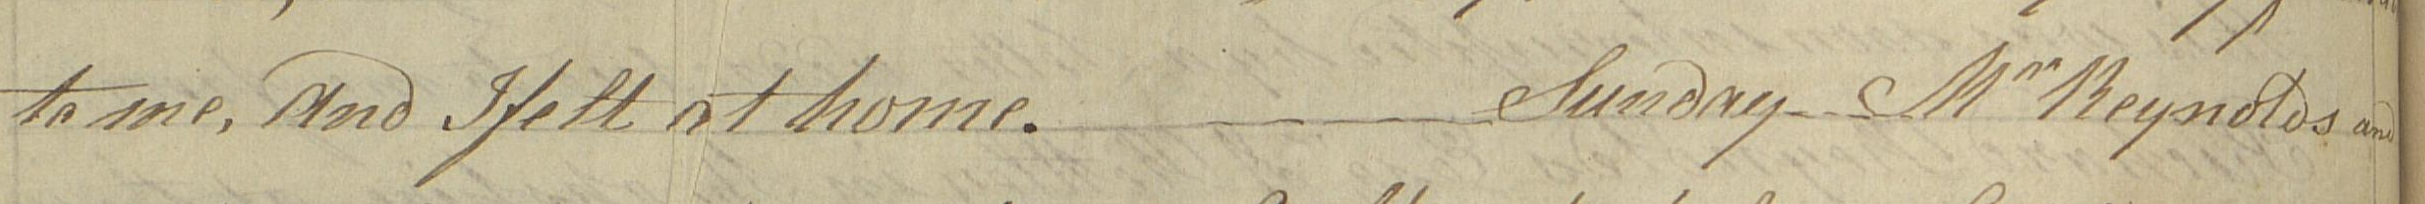to me and I felt at home. Sunday M^r. Reynolds and
